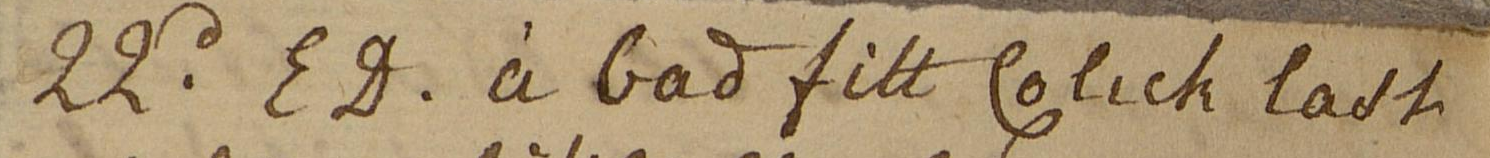22^d. ED. a bad fitt Colick last
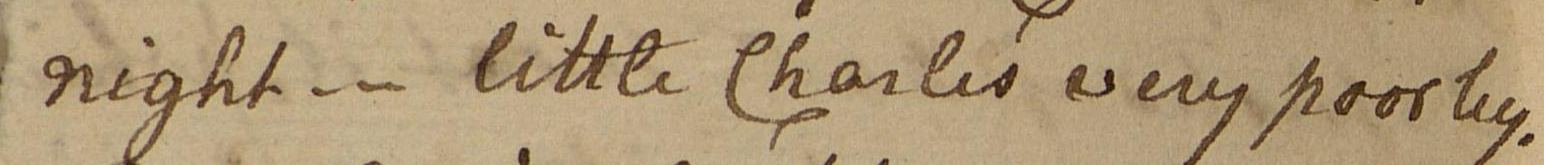night- little Charles very poorley.
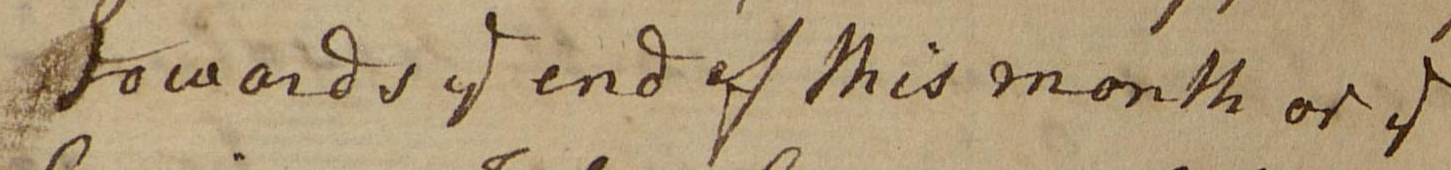towards y^e end of this month or y^e
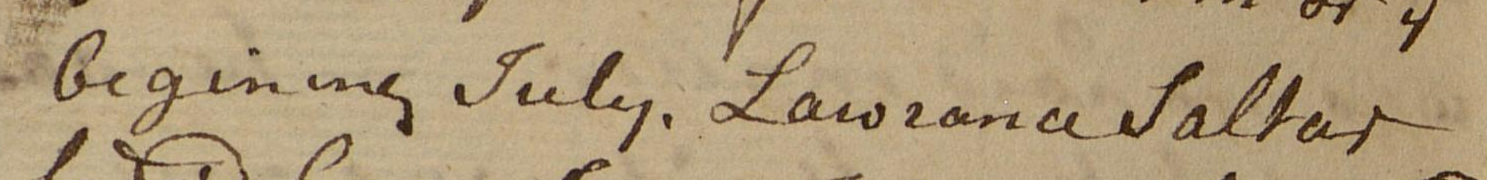begining July, Lawrance Saltar
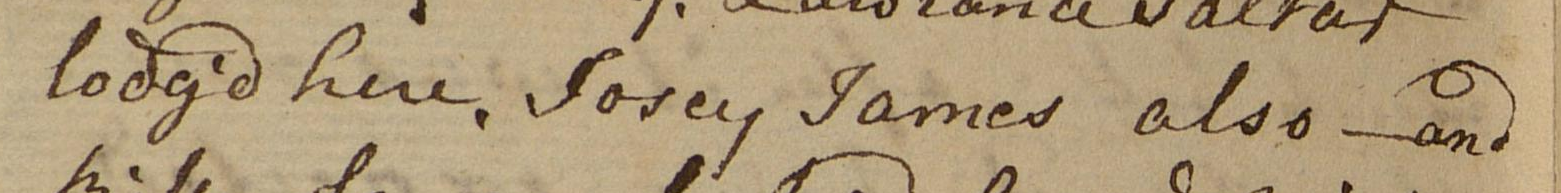lodg'd here, Josey James, also- and
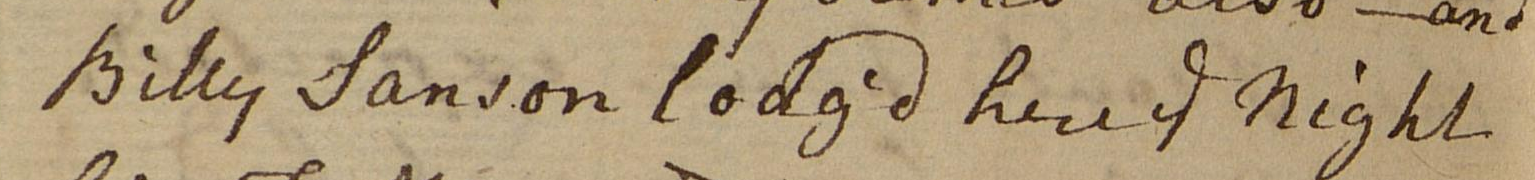Billy Sanson lodg'd here y^e night
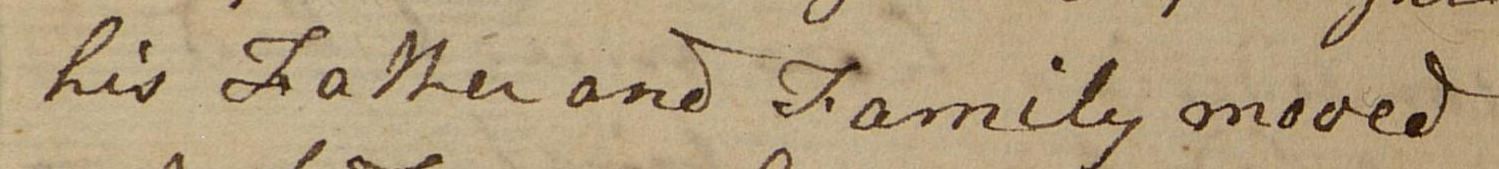his Father and Family moved
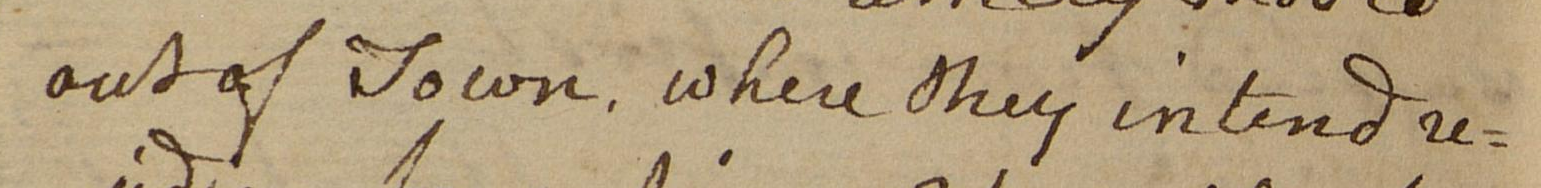out of Town, where they intend re-
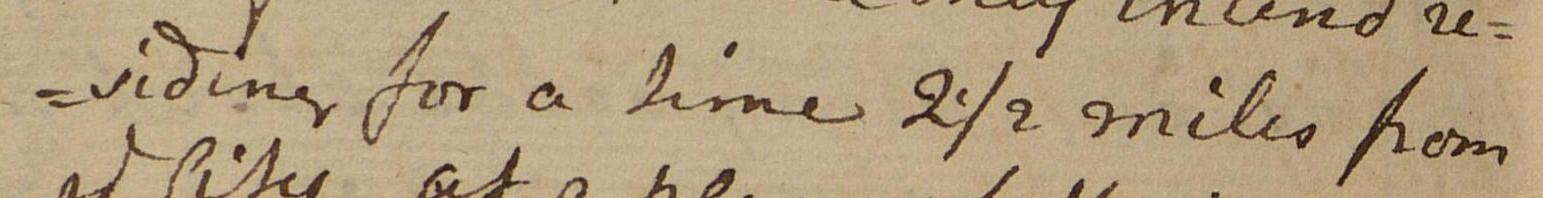-siding for a time 2 1/2 miles from
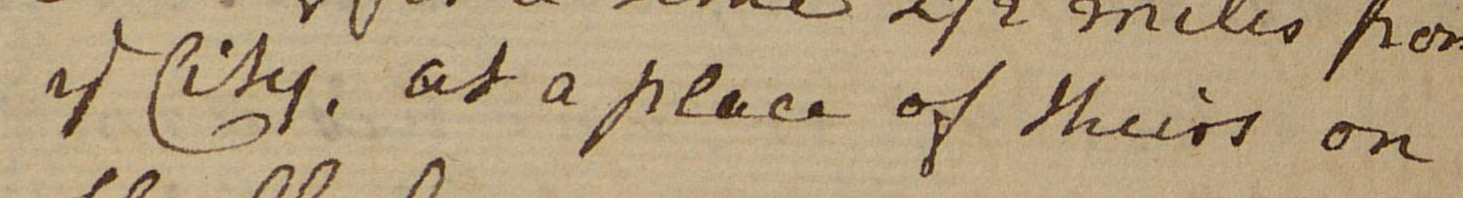y^e City. at a place of theirs on
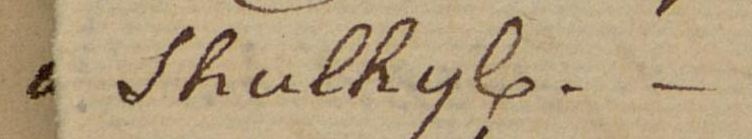Shulkyl-
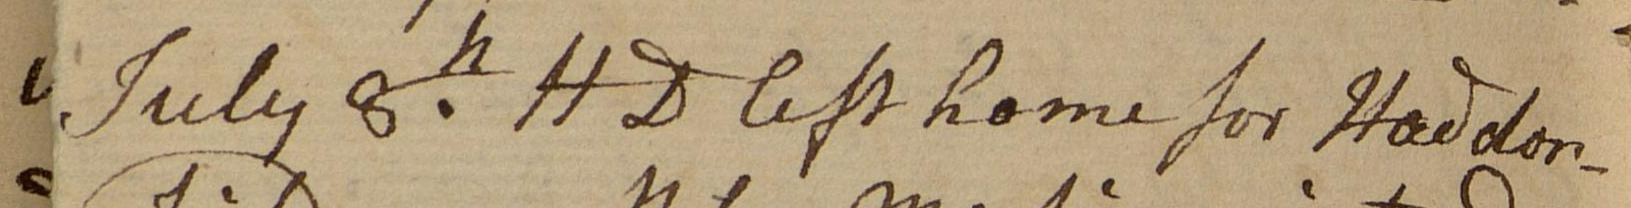July 8^h. HD left home for Haddon-
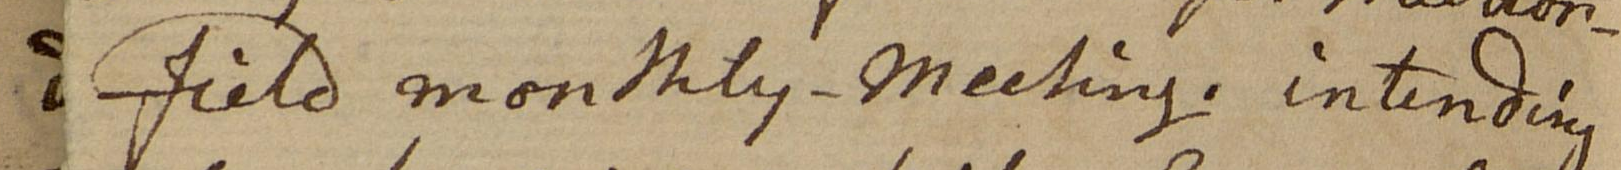field monthly- Meeting. intending
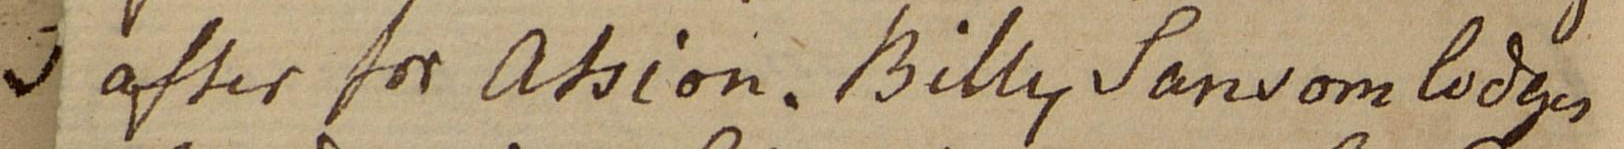after for Atsion. Billy Sansom lodges
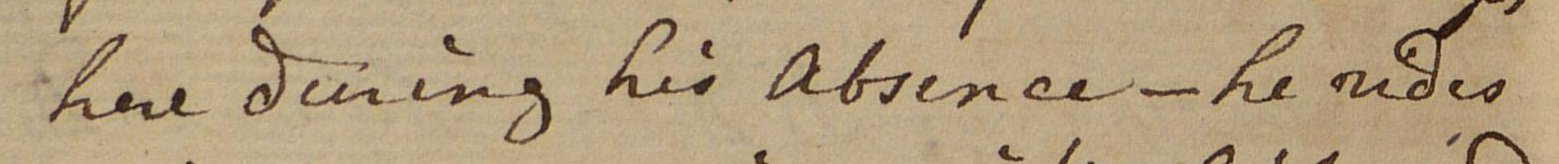here during his Absence- he rides
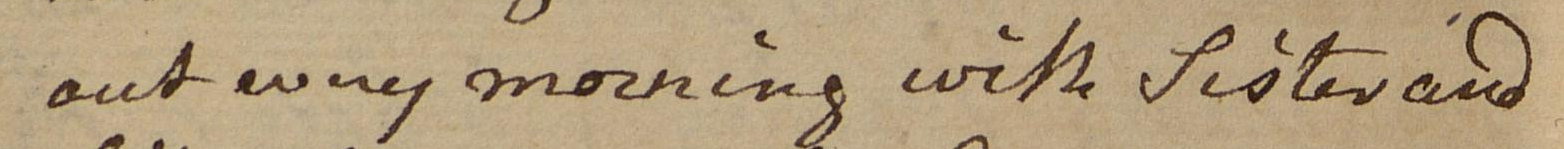out every morning with Sister and
